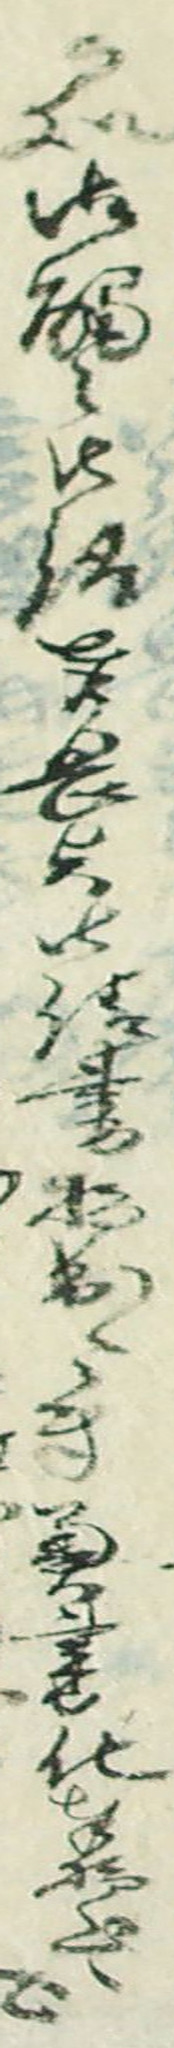候処御触之御趣奉畏旨御請書指出候に付奥書仕奉指上候以上
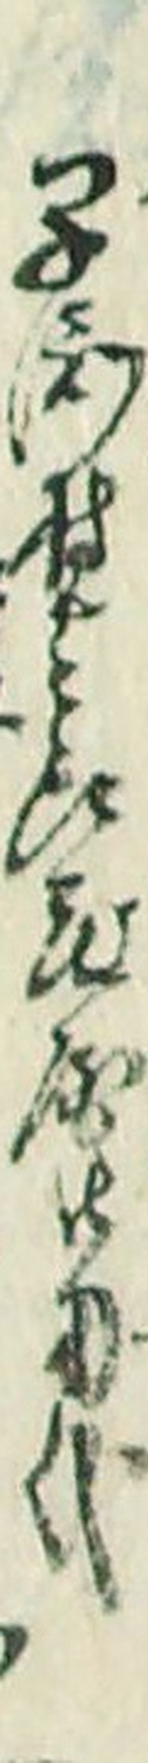早渕村与頭庄屋御用代

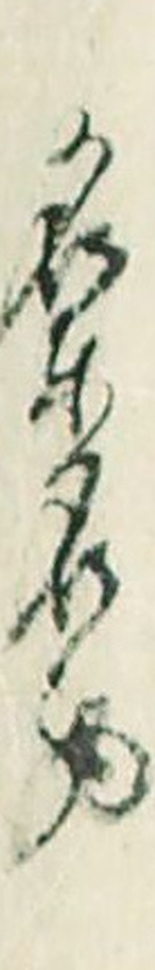名東名西
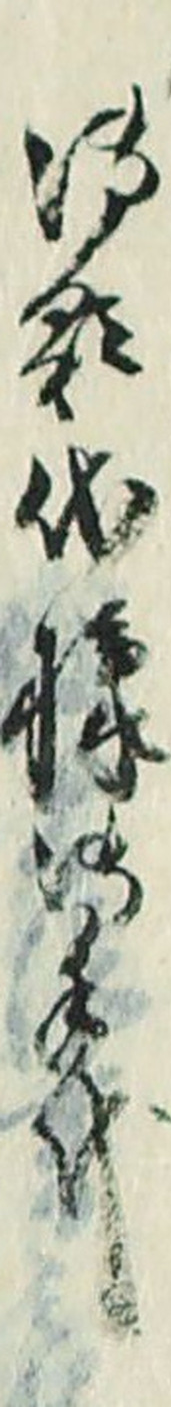御郡代様御手代
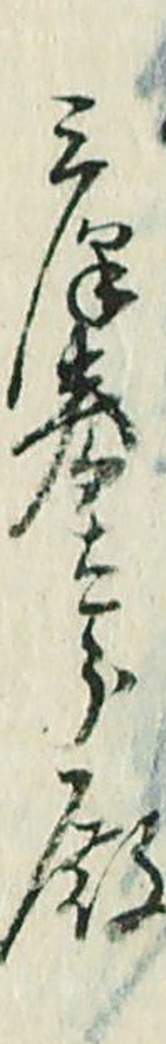三沢春太郎殿
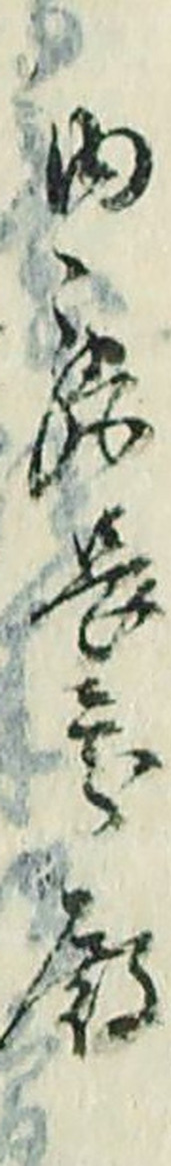内藤長三郎殿
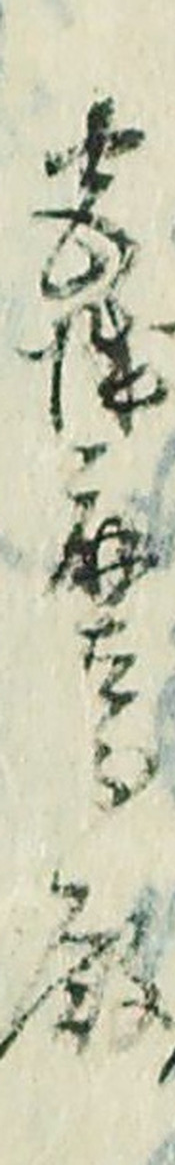宮城麻太郎殿
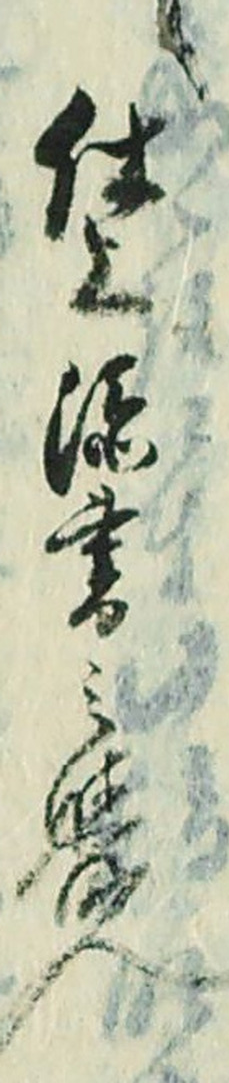仕上添書之覚
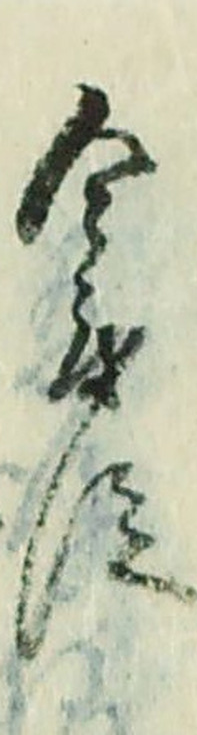今度従
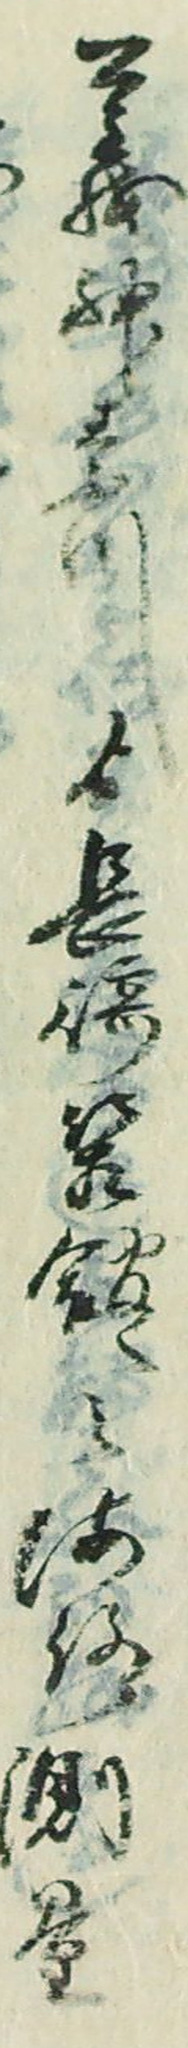公義神奈川ゟ長崎箱館へ之海路測量
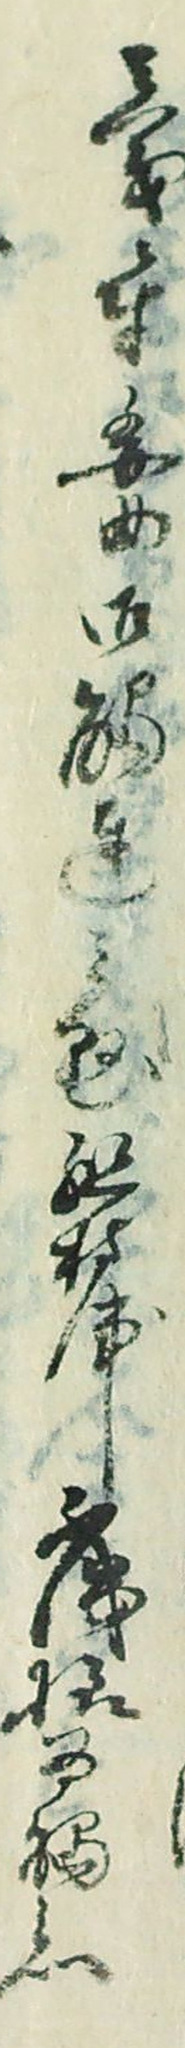有之義に付委曲御触達之趣組村浦不洩様為触知
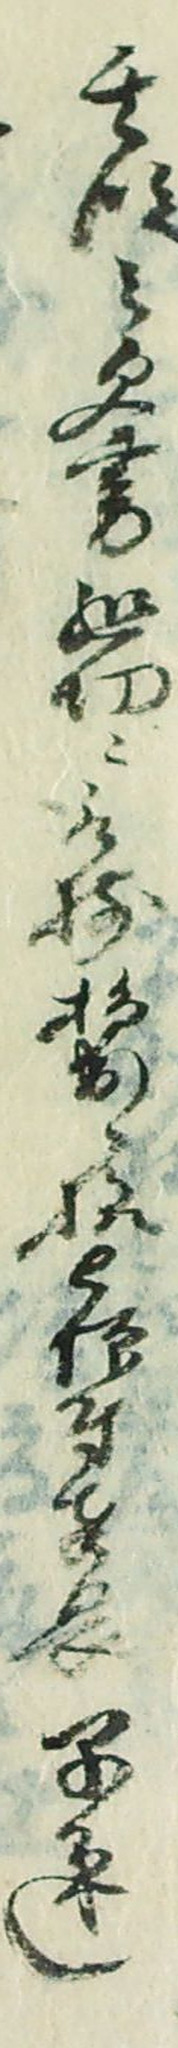其段御受書組切に取揃指出候様被仰付奉畏候早速
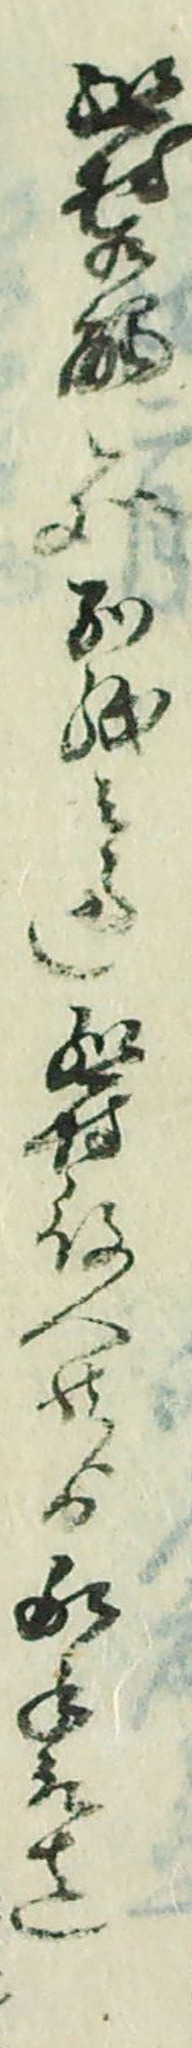組村相触候処別紙之通組村役人共ゟ私手元迄御受書
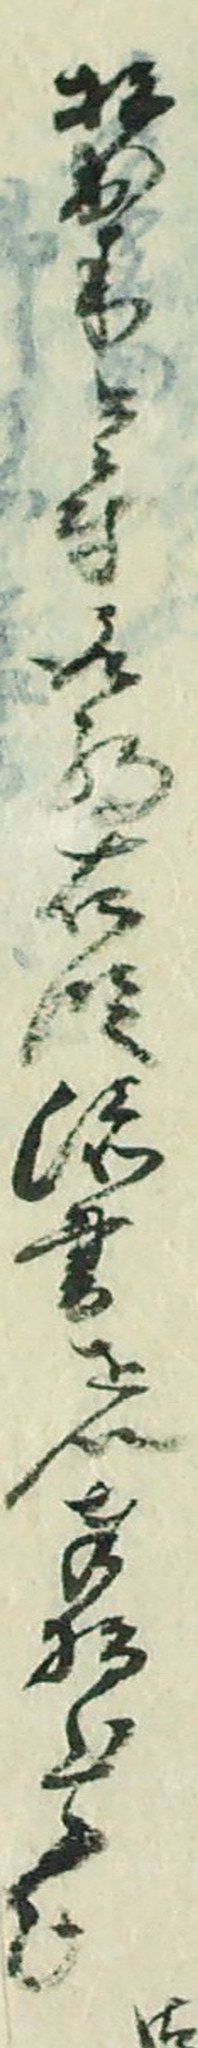指出来候に付取都右段添書を以奉指上候以上
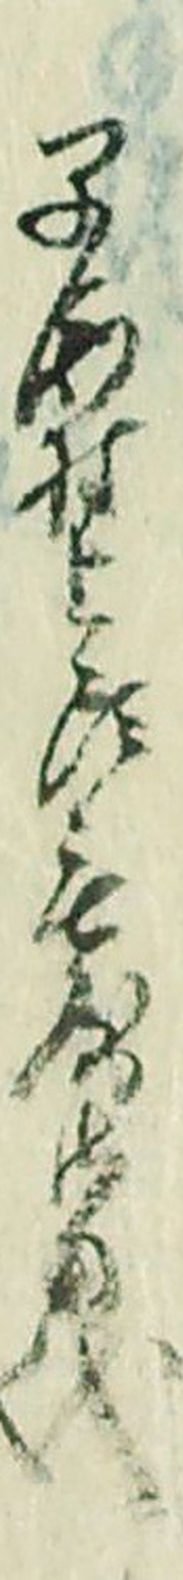早渕村与頭庄屋御用代
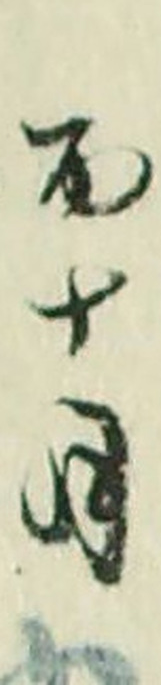酉十月
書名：諸御用御□受書控
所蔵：鳴門教育大学 Naruto University of Education
